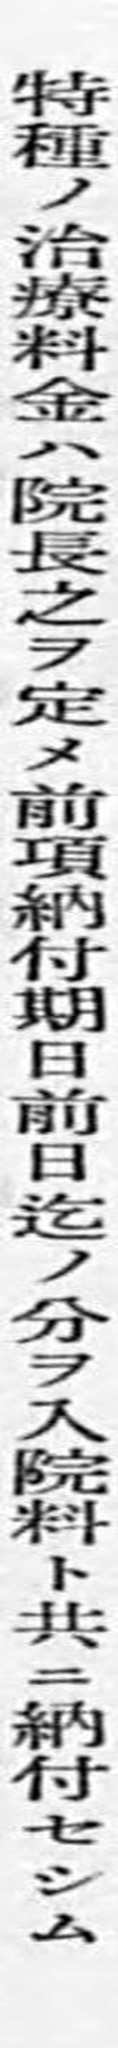特種ノ治療料金ハ院長之ヲ定メ前項納付期日前日迄ノ分ヲ入院料ト共ニ納付セシム
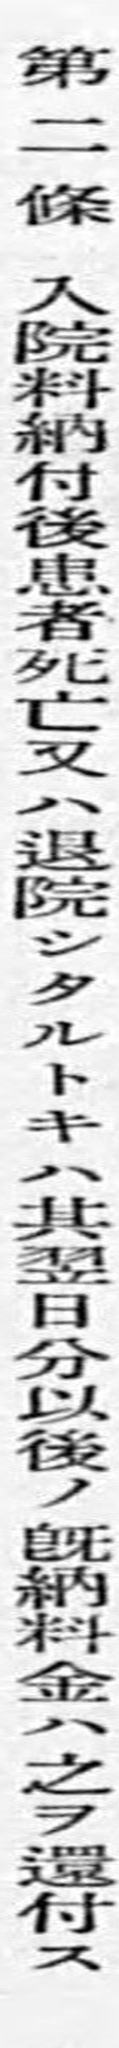第二条入院料納付後患者死亡又ハ退院シタルトキハ其翌日分以後ノ既納料金ハ之ヲ還付ス
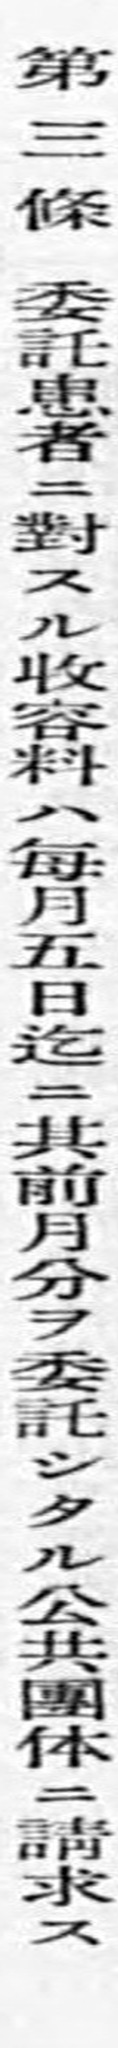第三条委託患者ニ対スル収容料ハ毎月五日迄ニ其前月分ヲ委託シタル公共団体ニ請求ス
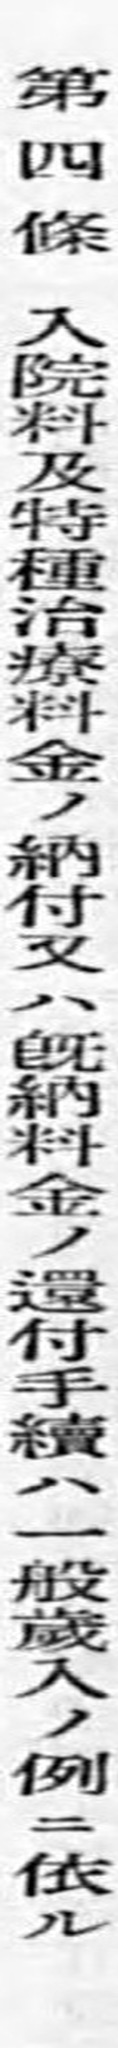第四条入院料及特種治療料金ノ納付又ハ既納料金ノ還付手続ハ一般歳入ノ例ニ依ル
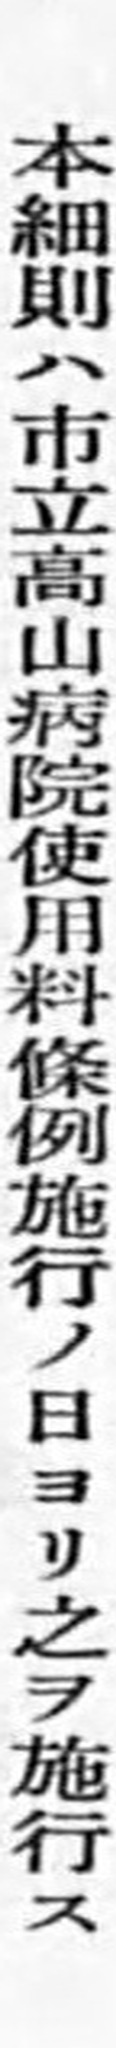本細則ハ市立高山病院使用料条例施行ノ日ヨリ之ヲ施行ス
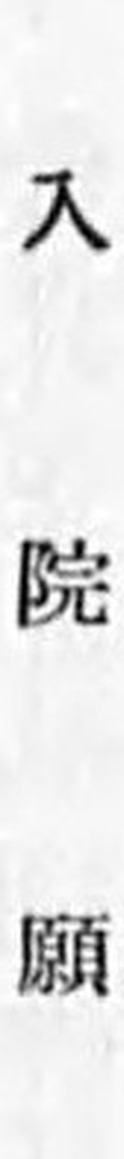入院願
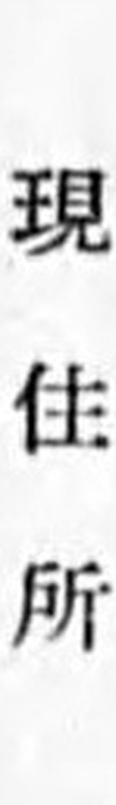現住所
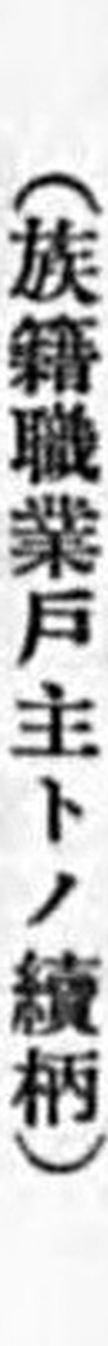(族籍職業戸主トノ続柄)
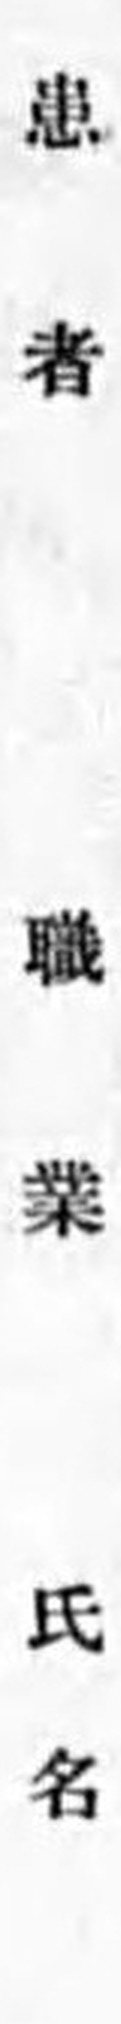患者職業氏名
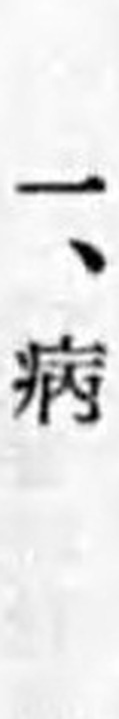一、病名
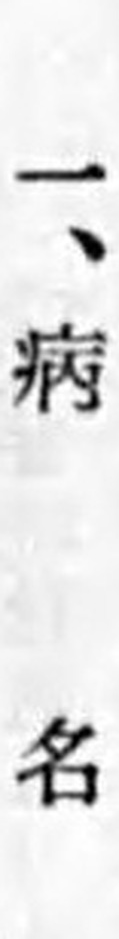一、病名

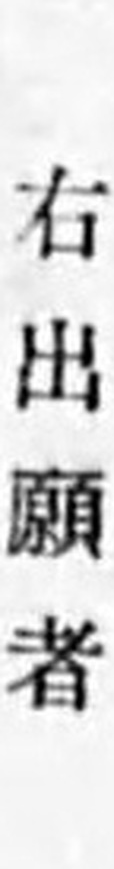右出願者
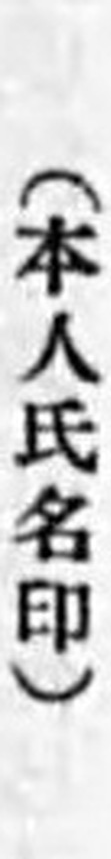(本人氏名印)
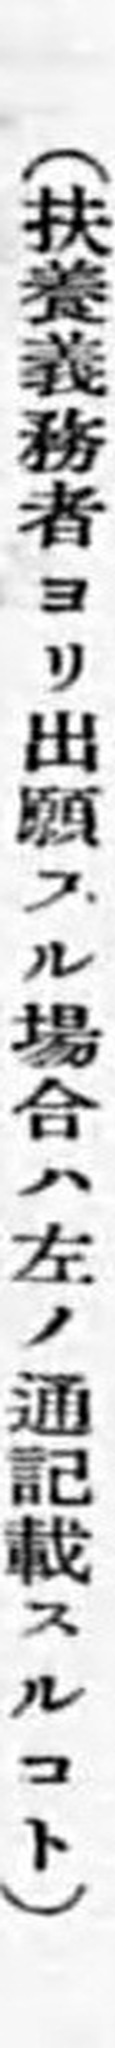(扶養義務者ヨリ出願スル場合ハ左ノ通記載スルコト)
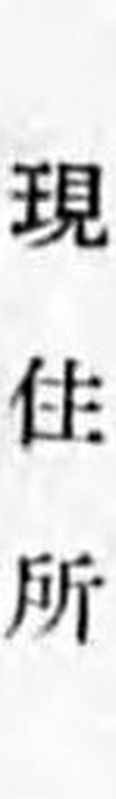現住所
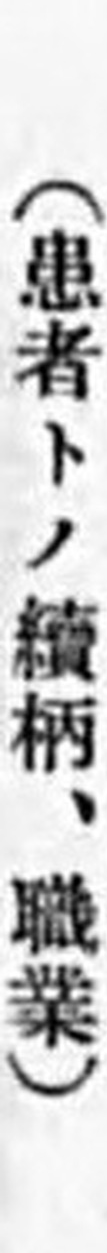(患者トノ続柄、職業)
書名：豊橋市立高山病院年報. 昭和12年度
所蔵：国立国会図書館 National Diet Library, JAPAN
